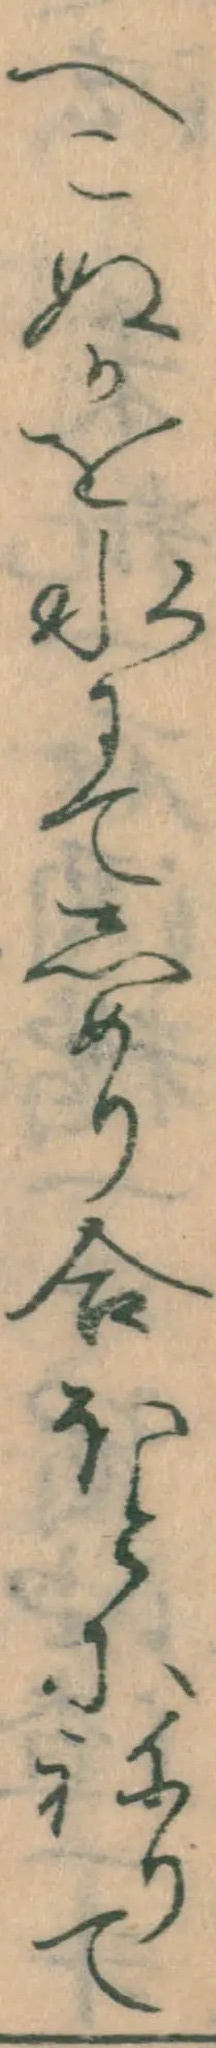へこぬかを水にてしめり合ほとにねりて
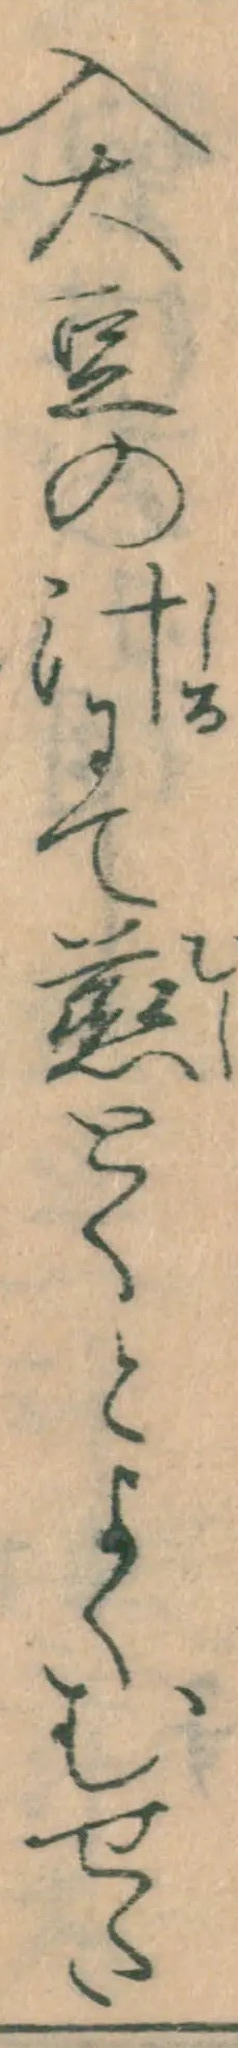入大豆の汁にて蒸とくとよくむせた
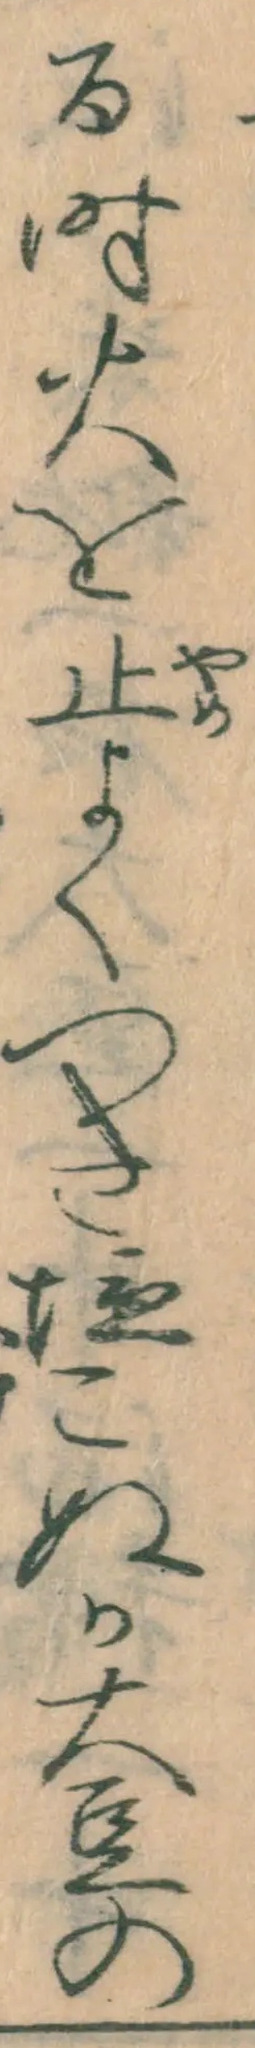る時火を止よくつき塩こぬか大豆の
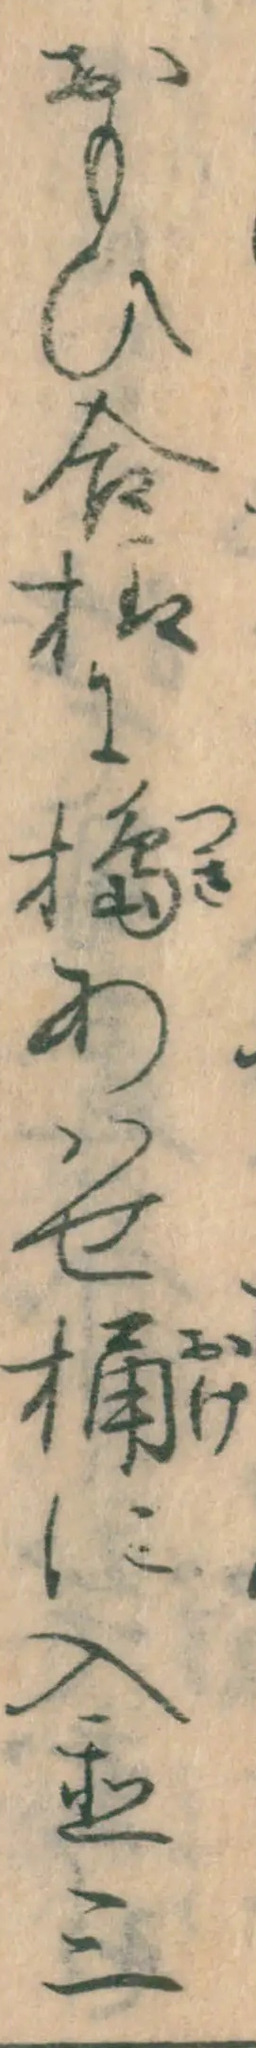おもひ合様に搗あはせ桶に入置三

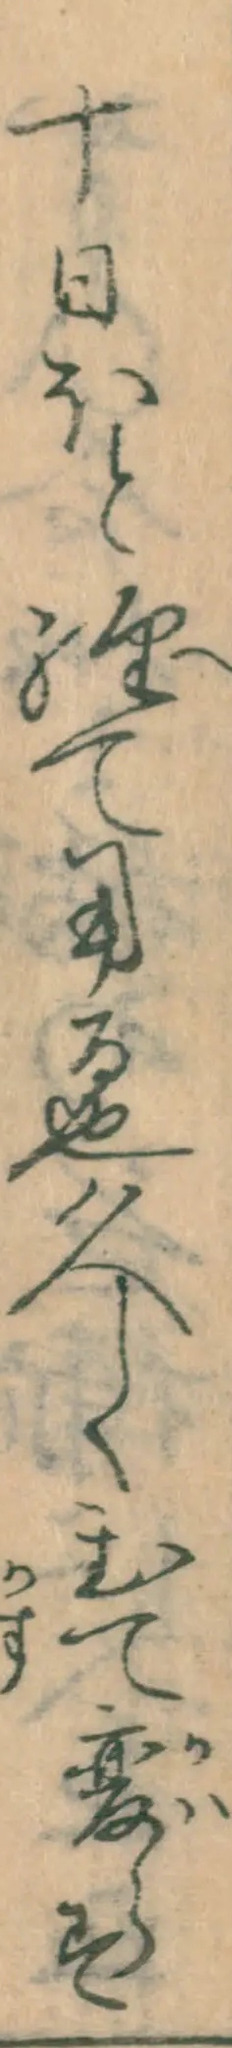十日ほと経て用る也久しく置て変らす
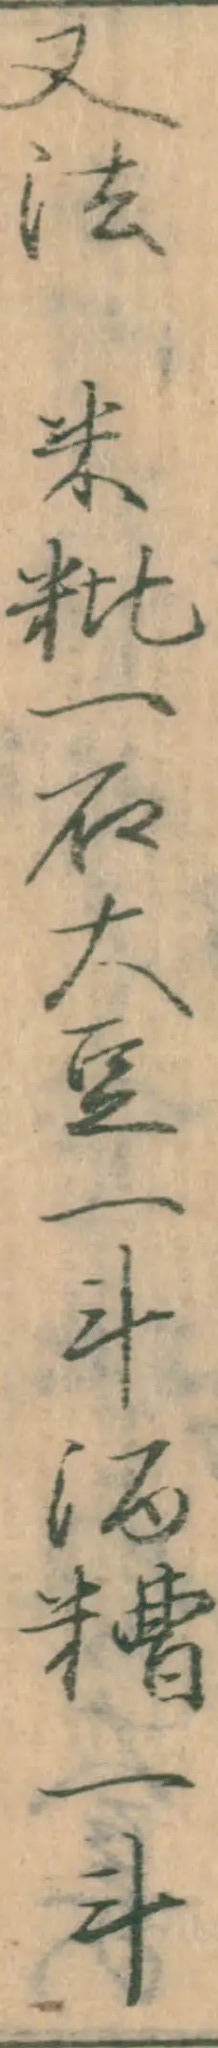又法米粃一石大豆一斗酒糟一斗
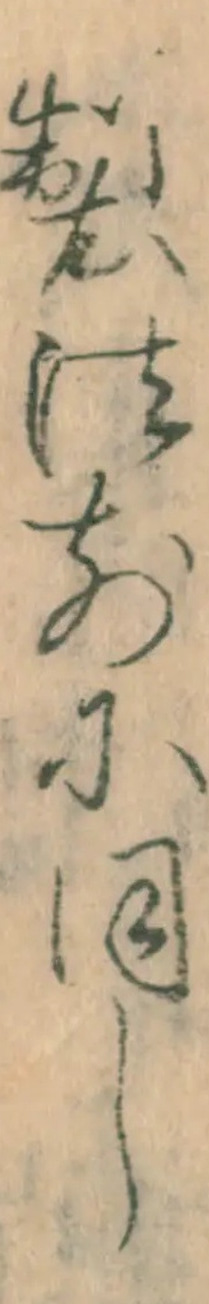製法前に同し
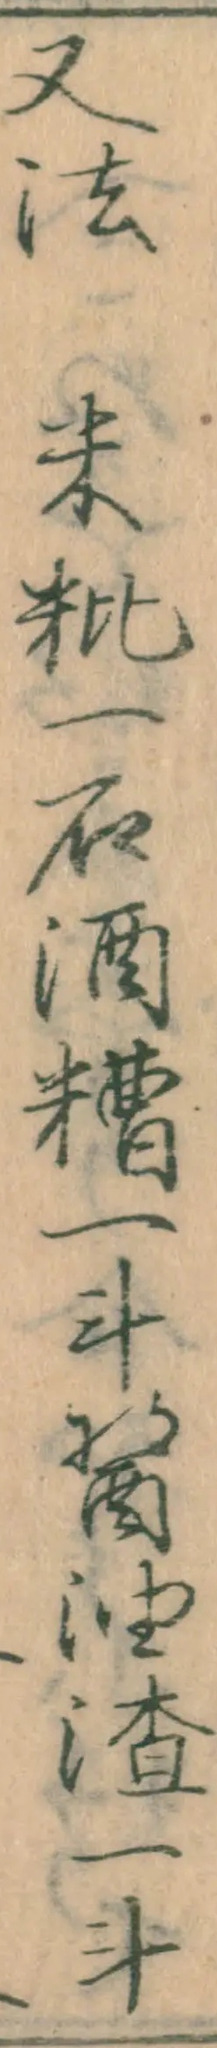又法米粃一石酒糟一斗醤油渣一斗
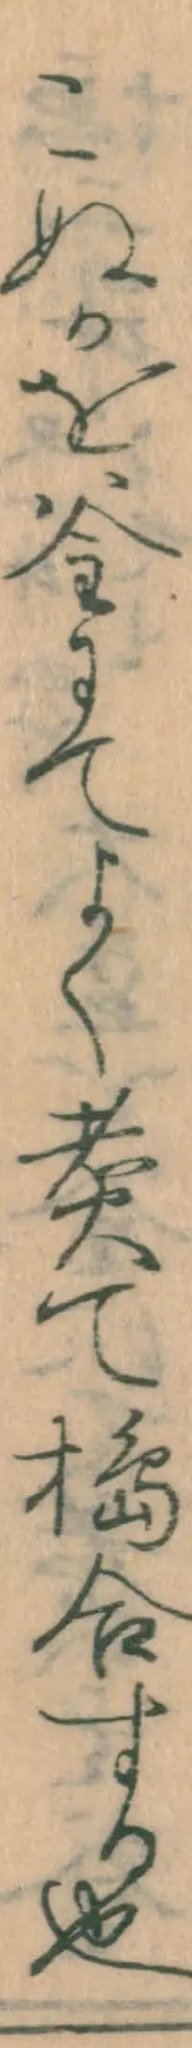こぬかを釜にてよく煮て搗合する也
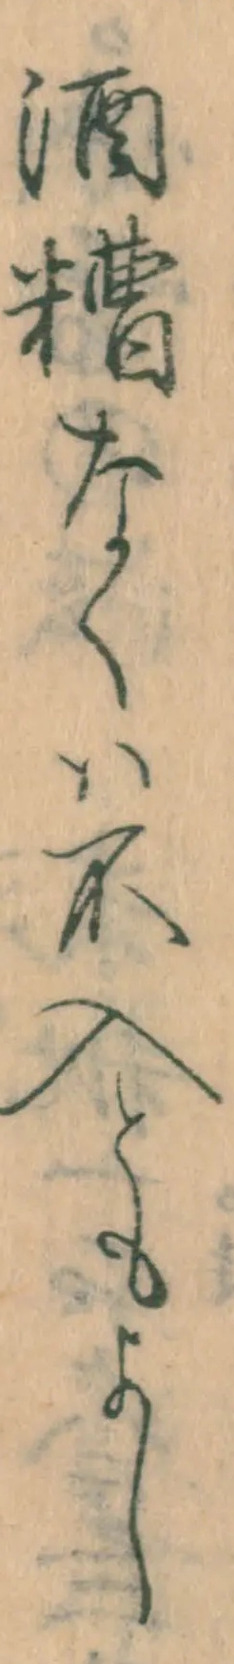酒糟なくは不入ともよし
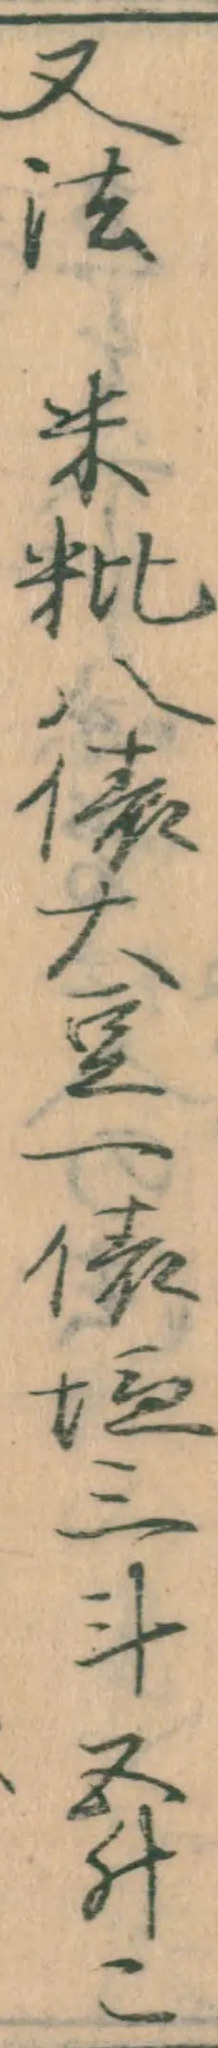又法米粃八俵大豆一俵塩三斗五升こ
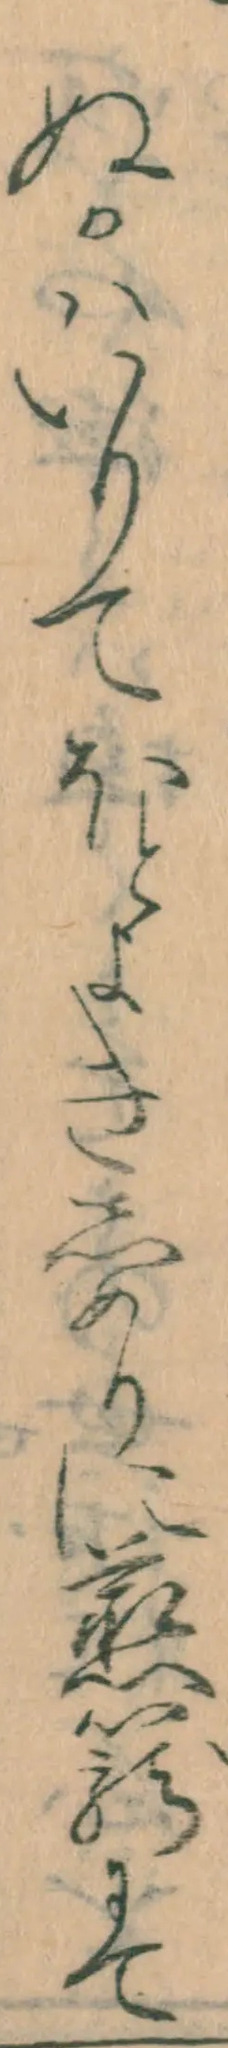ぬかはいりてほとよきしめりに蒸篭にて
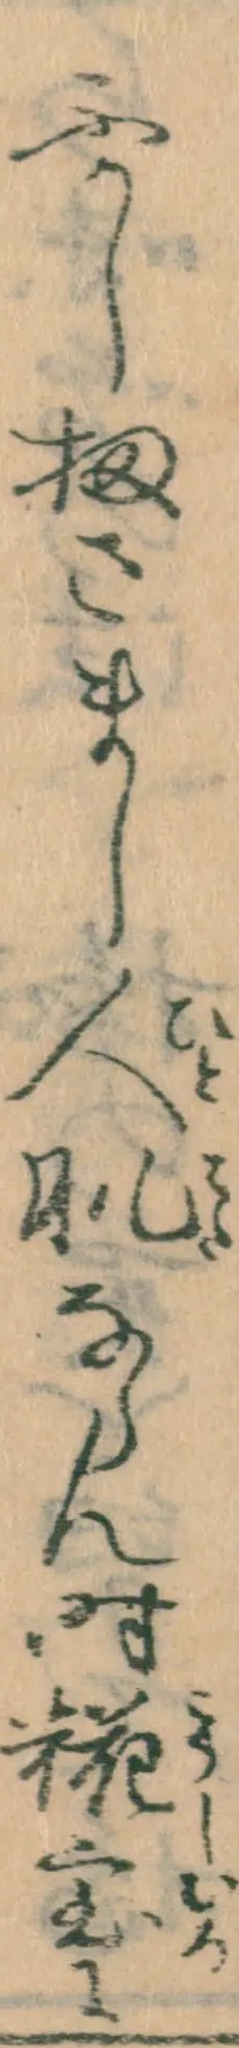ふかし扨さまし人肌ならん時糀室に
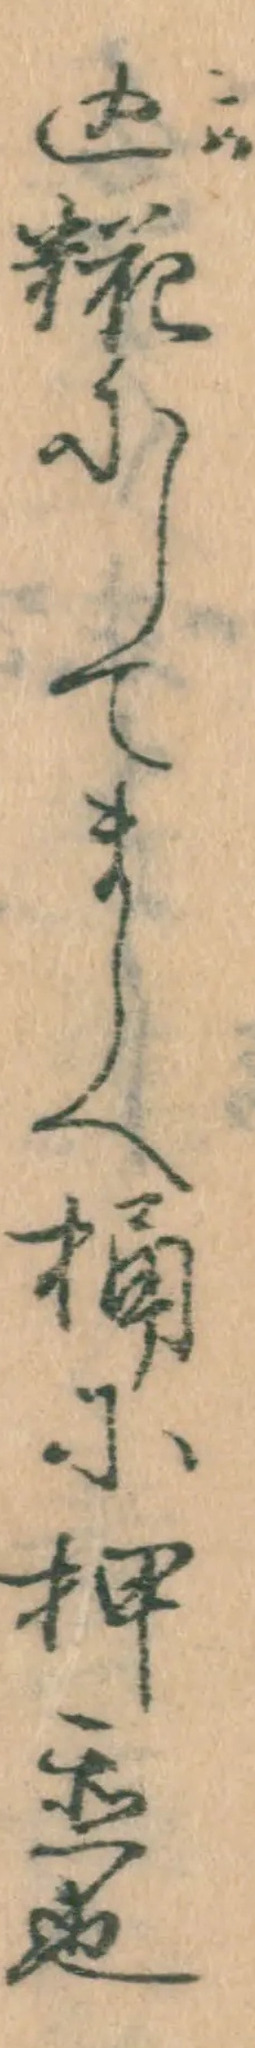込糀にしてましへ桶に押置也
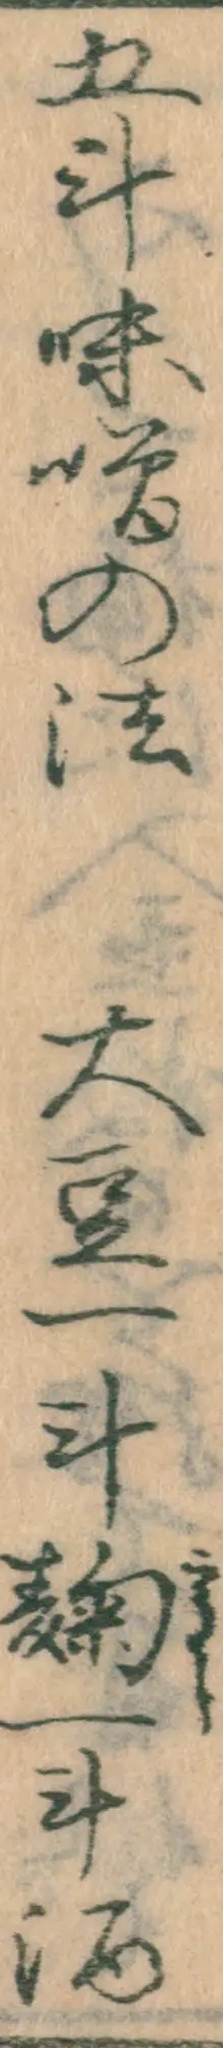五斗味噌の法大豆一斗麴一斗酒
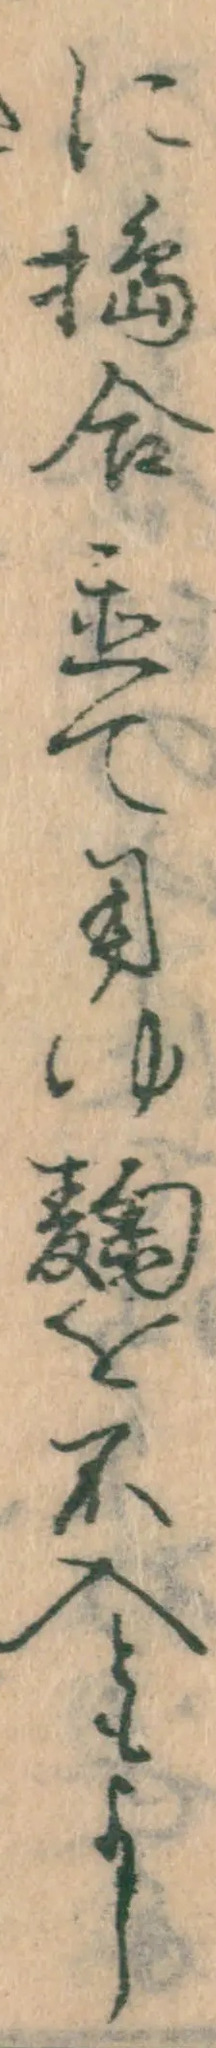に搗合置て用ゆ麴を不入ともよし
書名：かてもの
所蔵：国立国会図書館 National Diet Library, JAPAN
